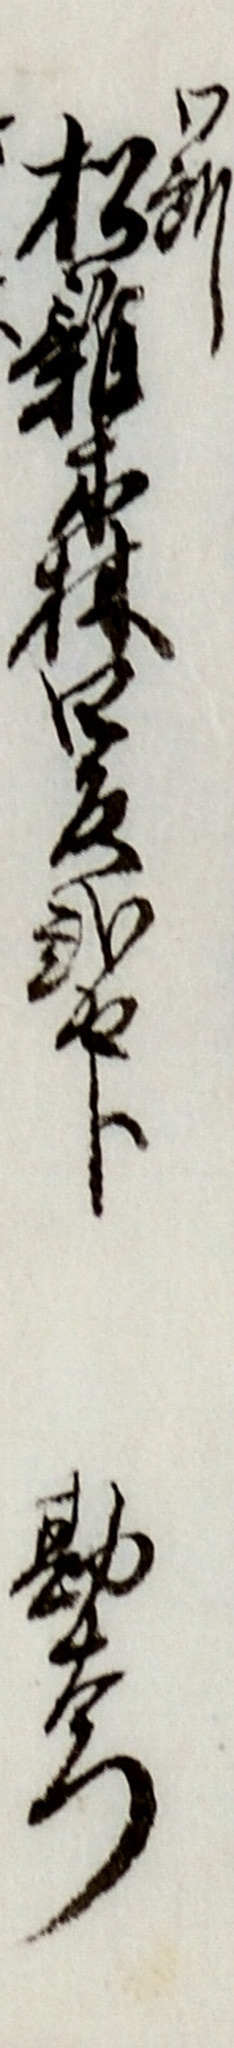松雑木林四反弐セ歩勘右衛門
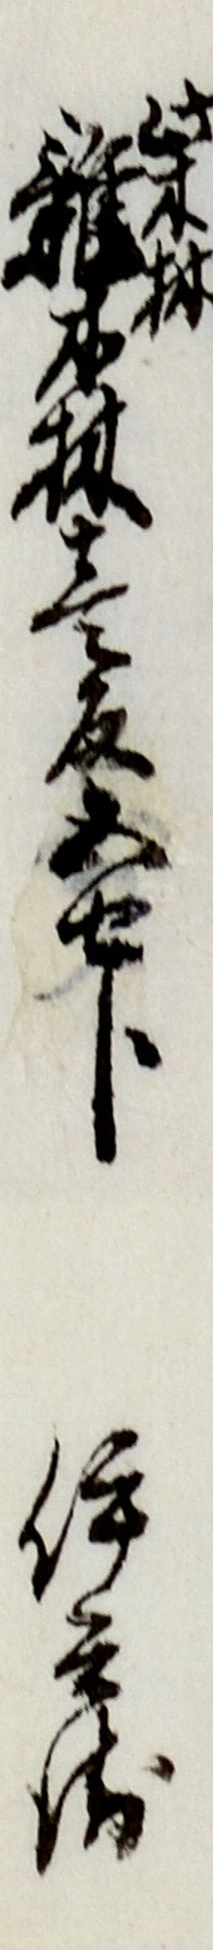雑木林壱反五セ歩伊兵衛

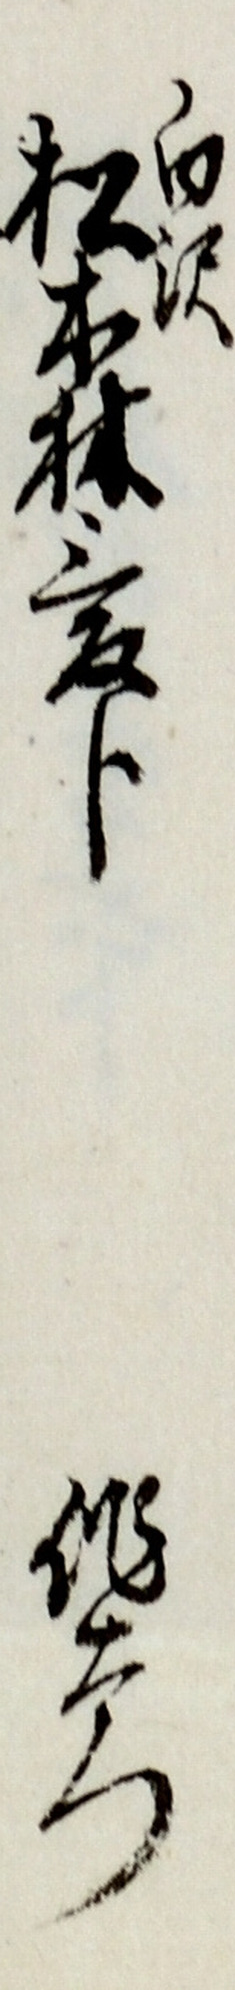松木林三反歩作右衛門
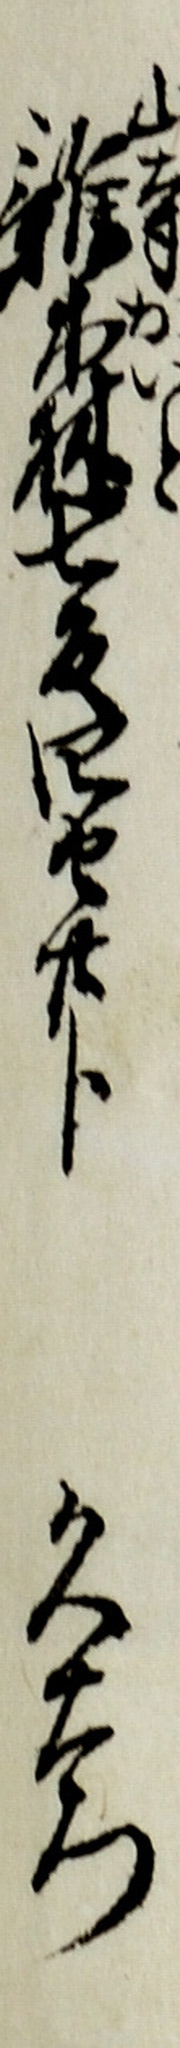雑木林七反四セ廿歩久右衛門
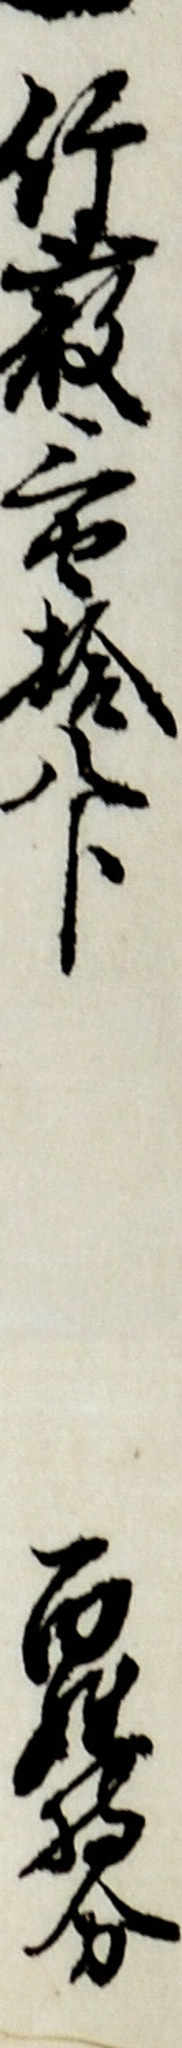一竹藪三セ拾八歩百姓持分
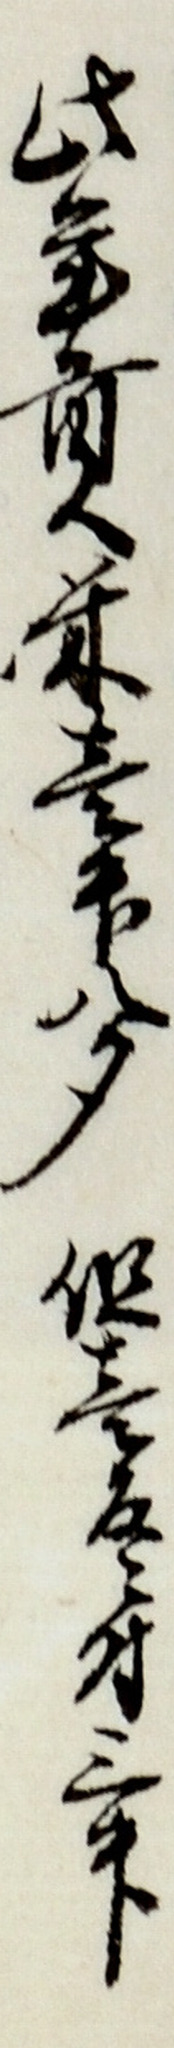此年貢米壱升八勺但壱反ニ付三升
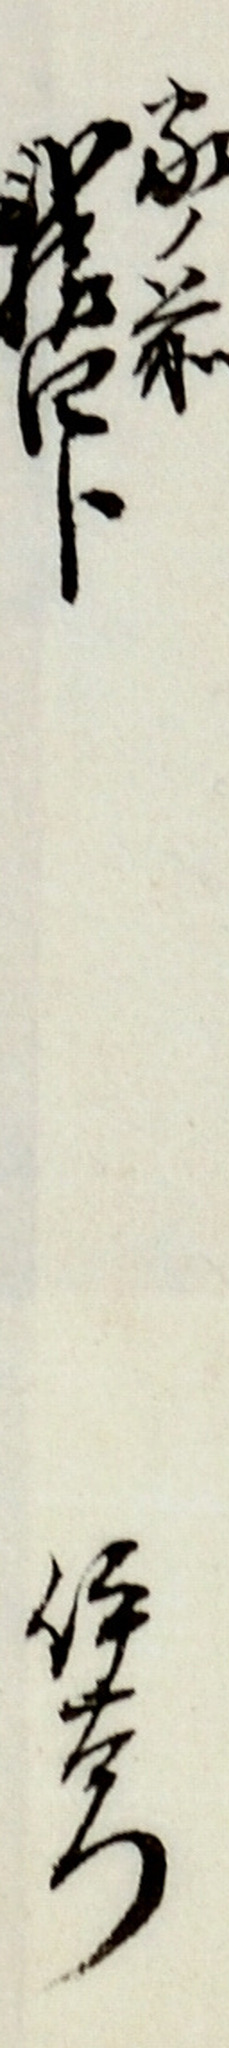弐拾四歩伊右衛門
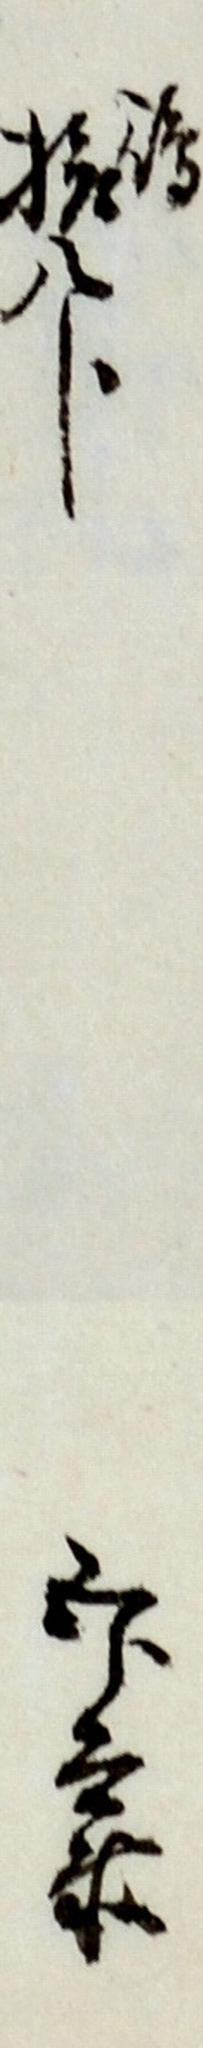拾八歩五郎兵衛
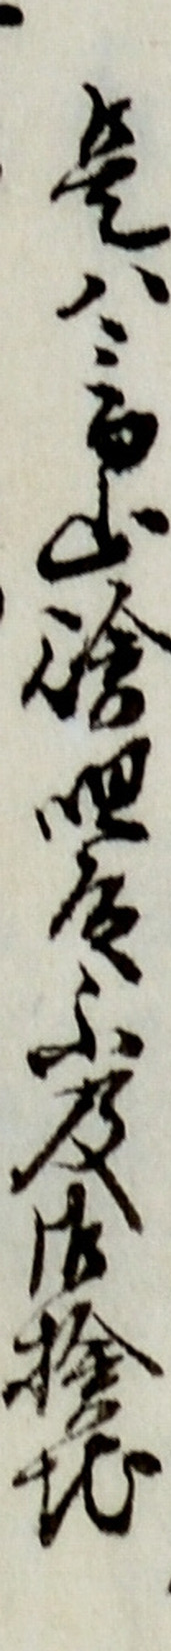是ハ高山嶮岨故不及御検地
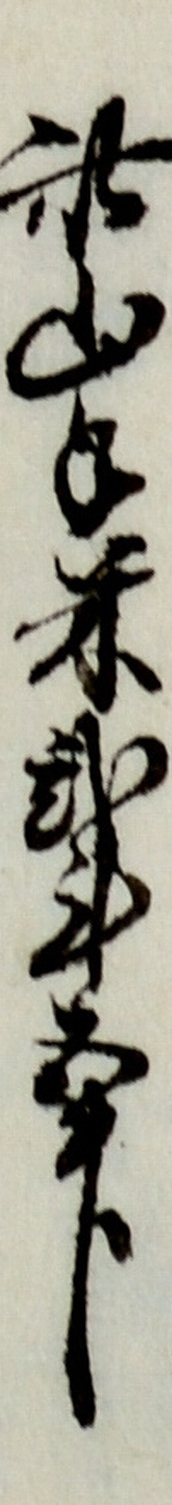此山手米弐斗五升

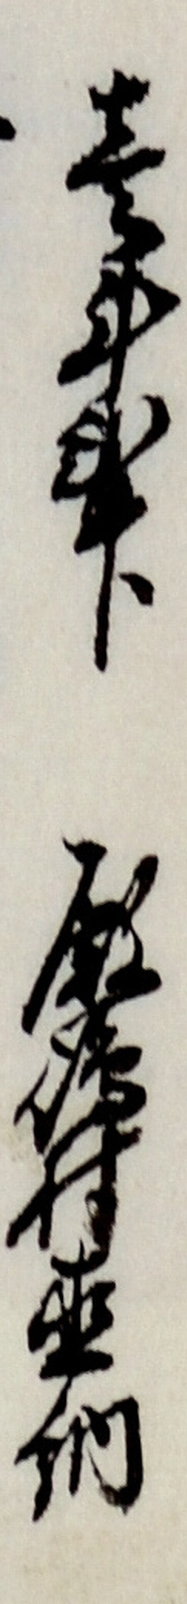壱斗弐升殿島村直納
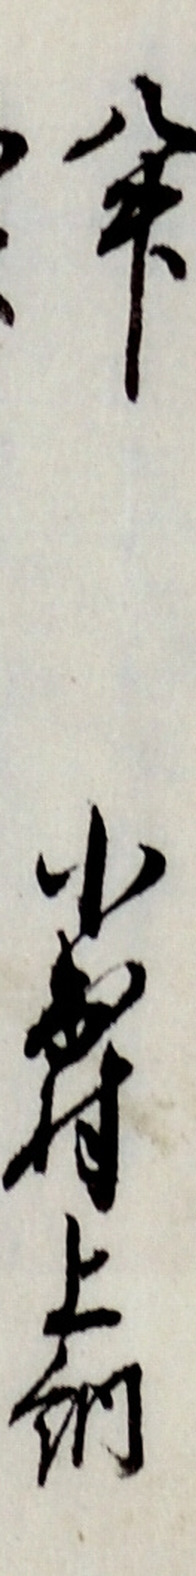八升小出村上納
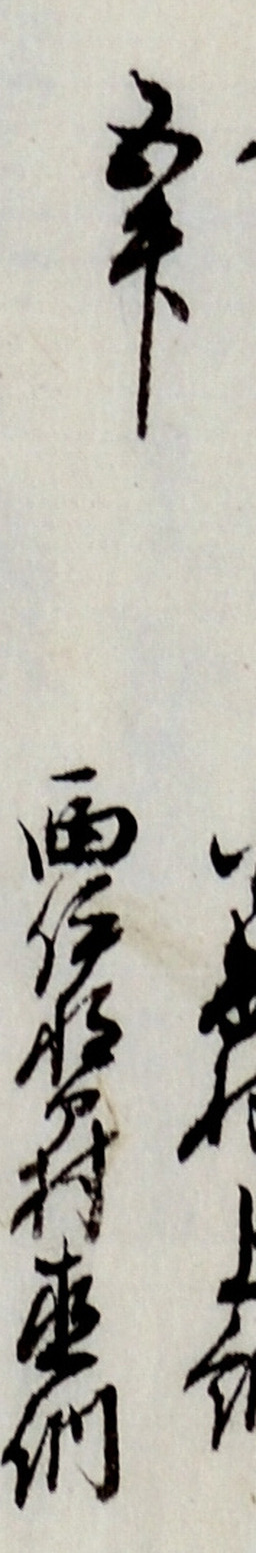五升西伊那部村直納
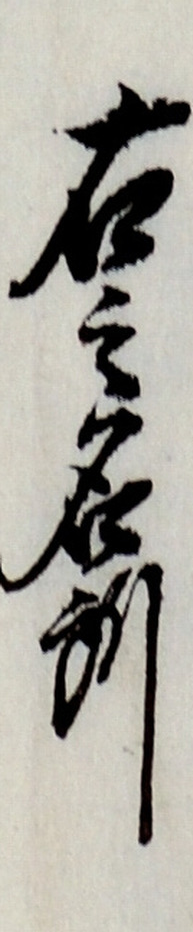右之名所
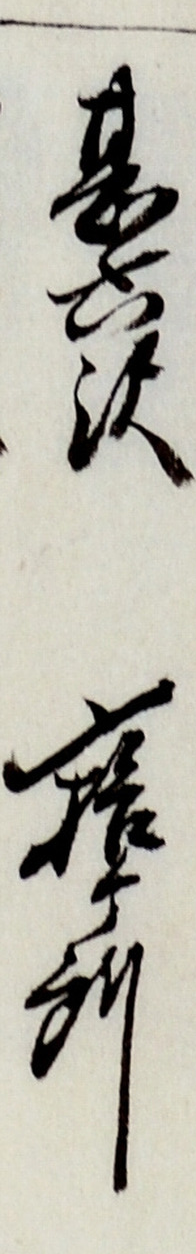甚六沢〆拾ケ所
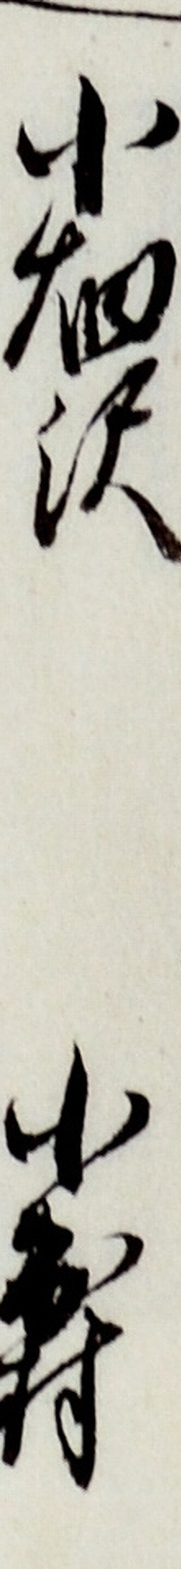小畑沢小出村
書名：御領分中山林社地手控
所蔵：伊那市立高遠町図書館・合同会社AMANE
